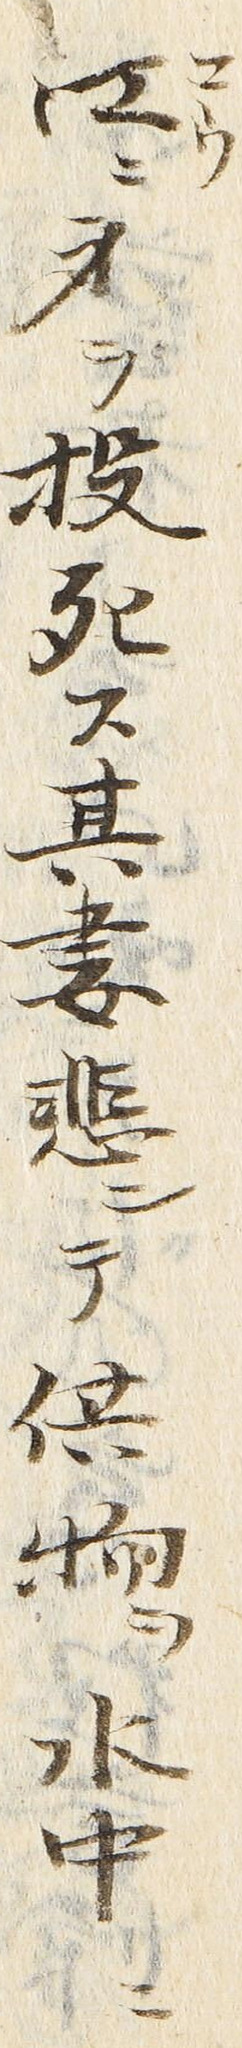江に身を投死す其妻悲んて供物を水中に
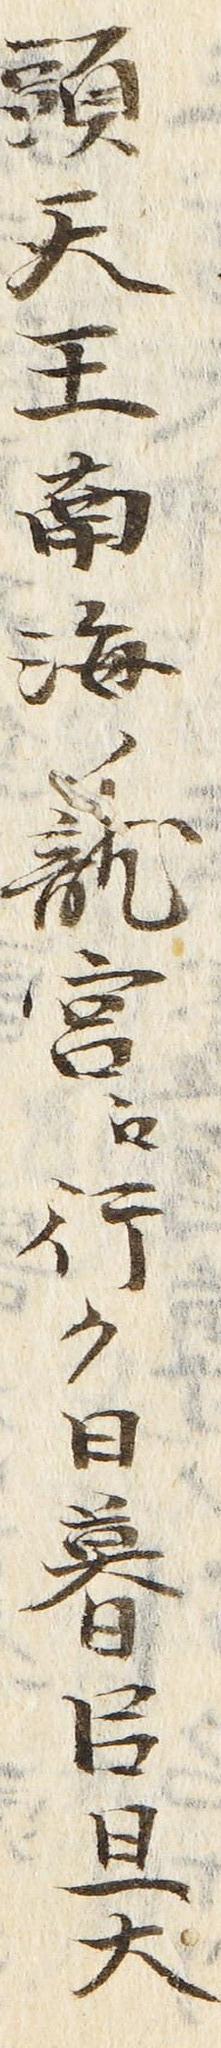頭天王南海の龍宮え行く日暮㠯旦大
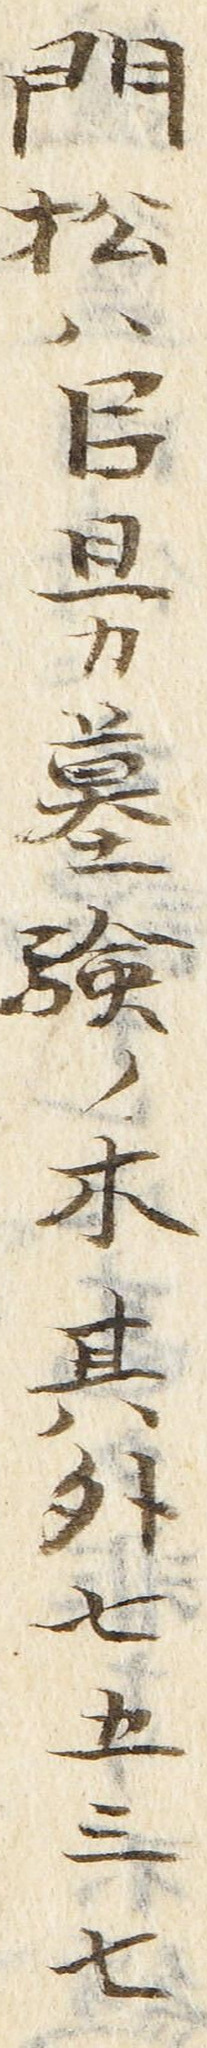門松は㠯旦か墓験の木其外七五三七
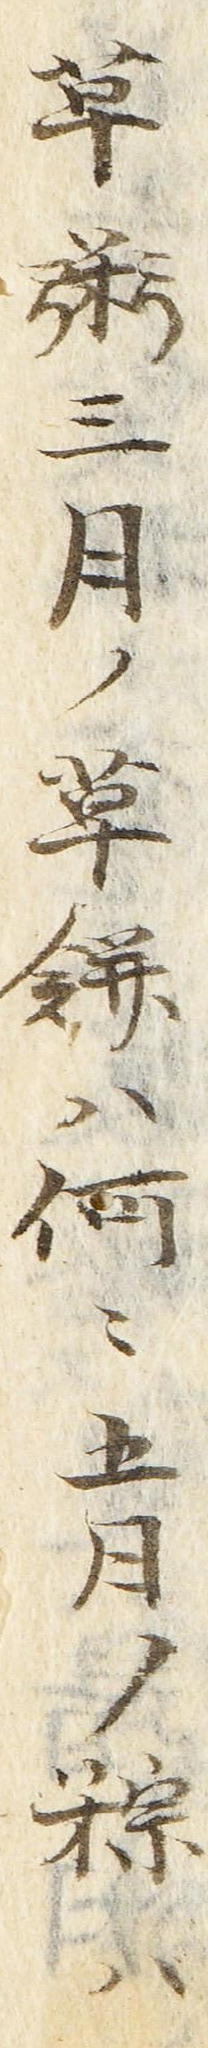草粥三月ノ草餅は何々五月の粽は

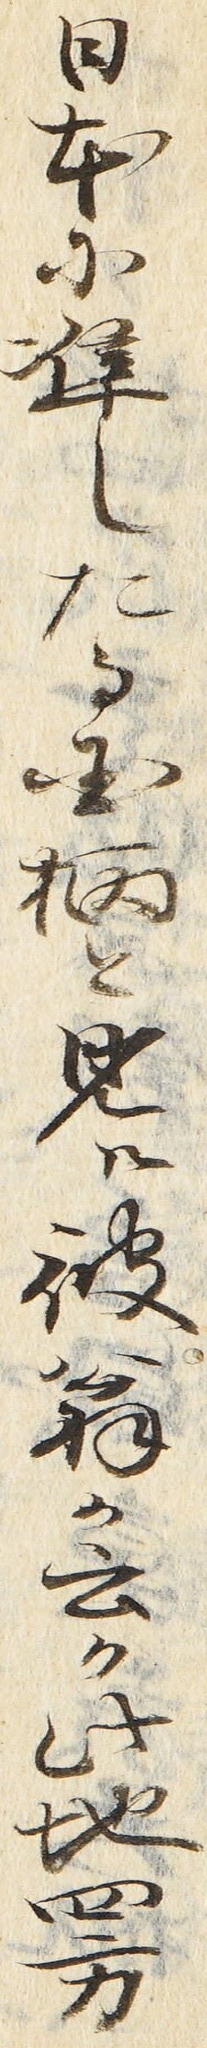日本に準したる国柄と見る彼翁の云く此地四方
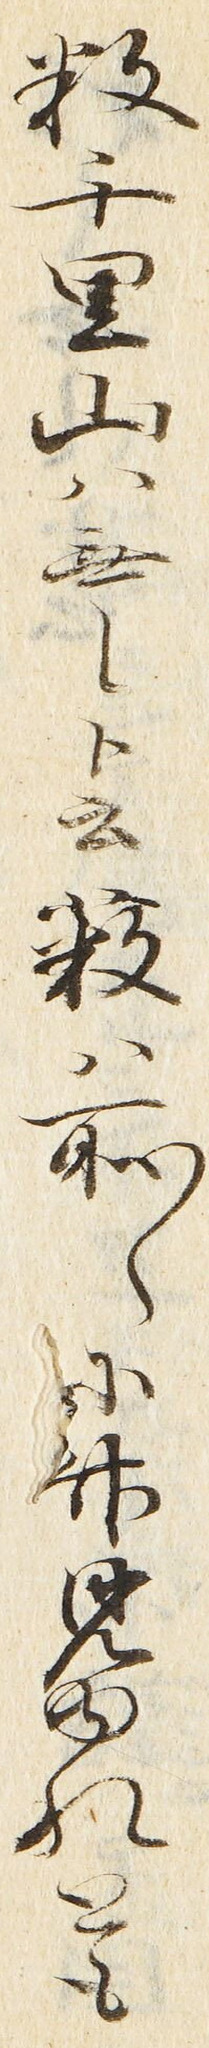数千里山は無しと云薮は所〳〵に竹見ゆれとも
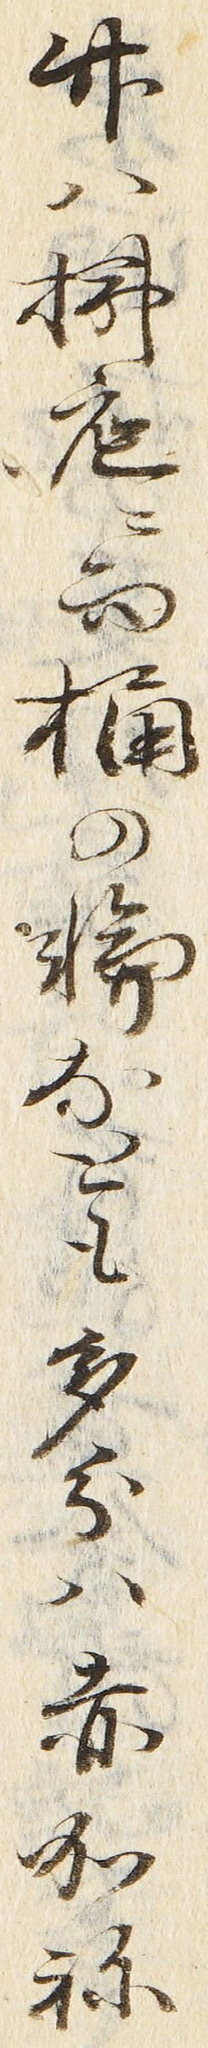竹は払底に而桶の輪なとも多分は赤かね
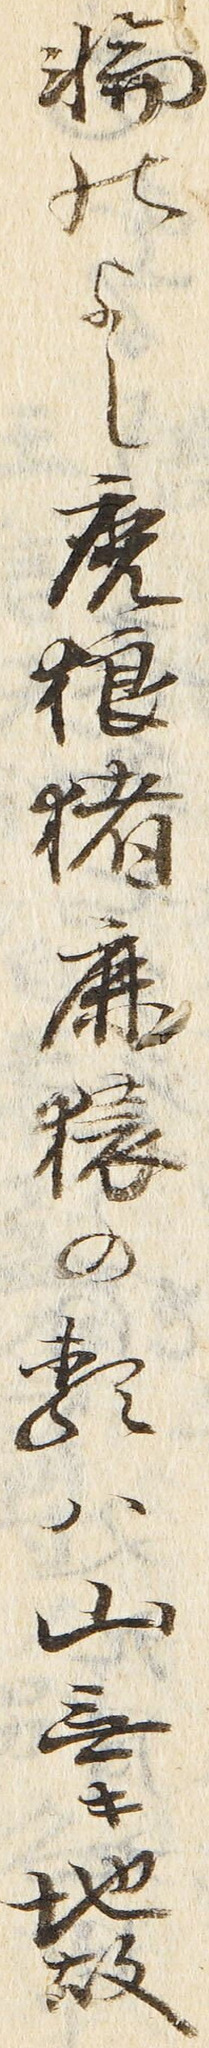輪のよし虎狼猪鹿猿の類は山無き地故
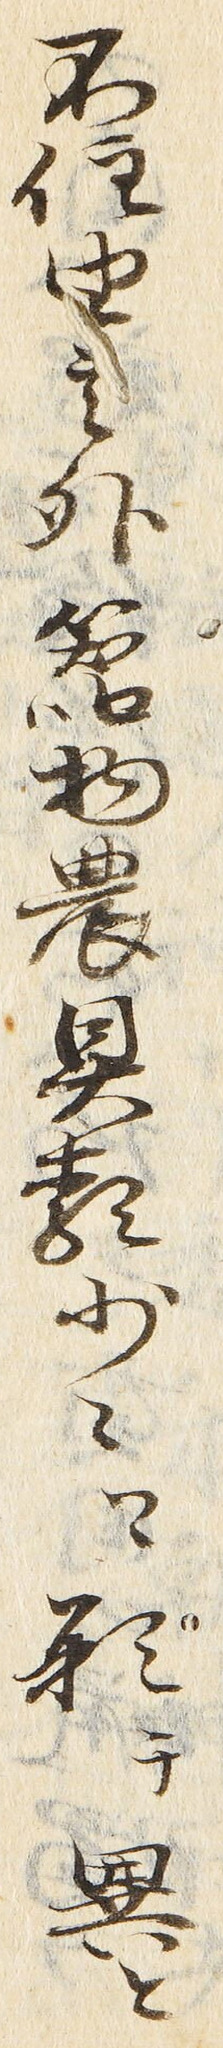不住由之外物農具類少々ッヽ形ち異と
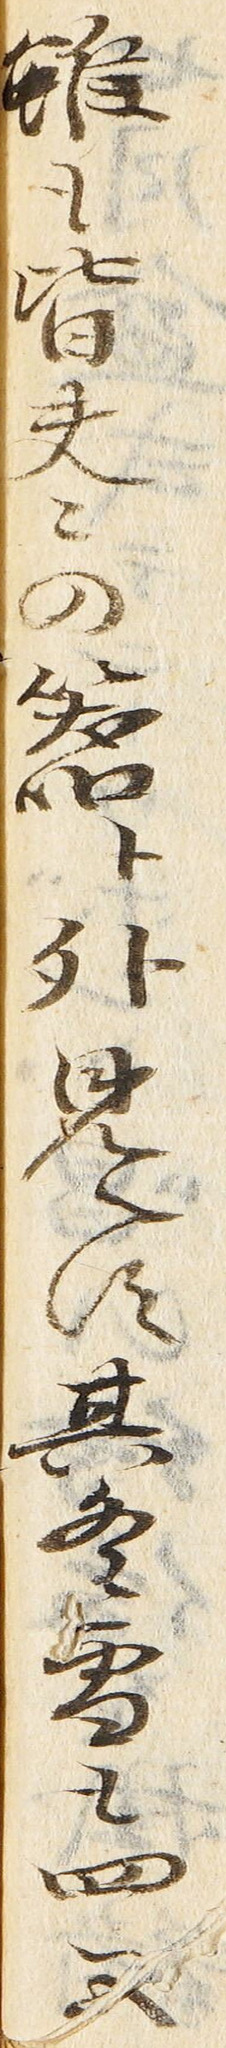雖も皆夫々のと外見へす其冬雪も四五
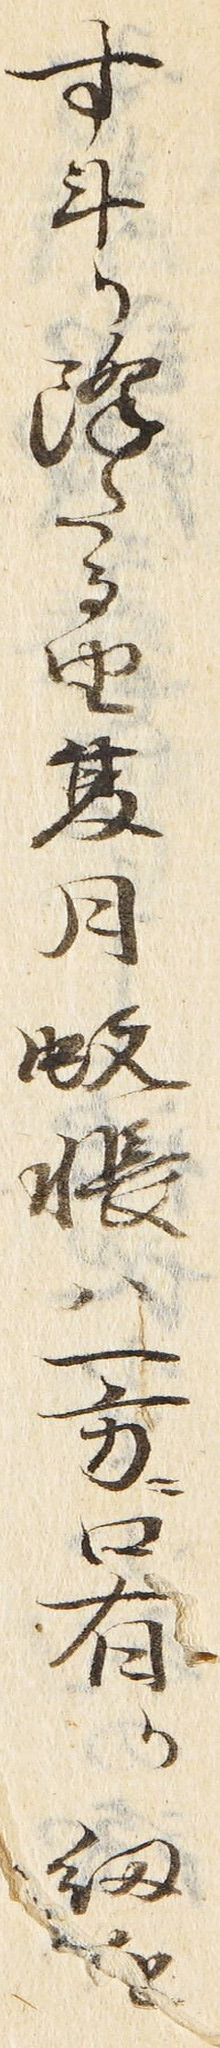寸計り降たる由夏月蚊帳は一方に口有り細を
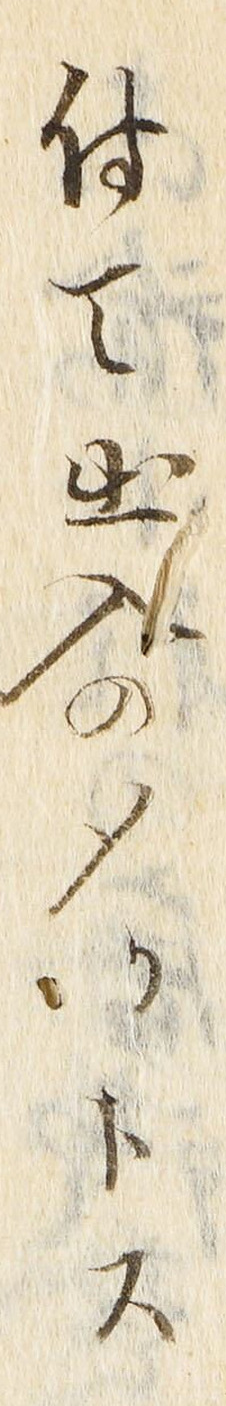付て出入の〆りとす
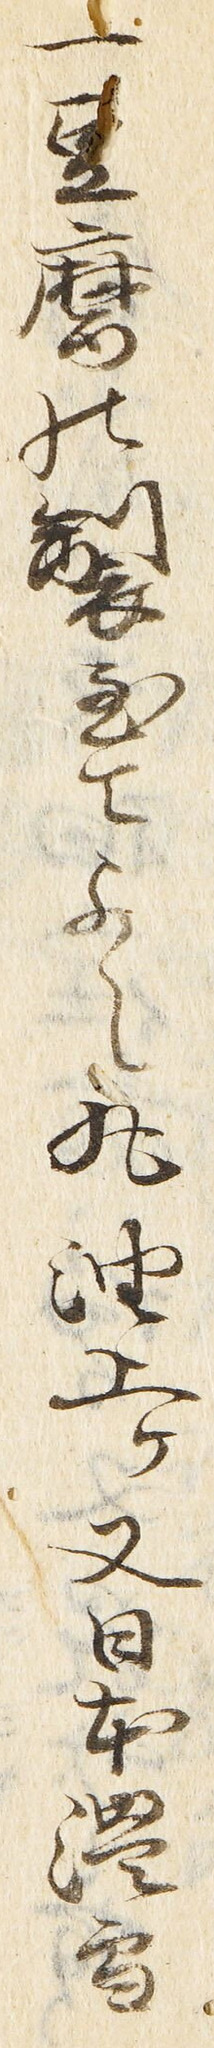一豆腐の製至てよし丸油上け又日本濃雪
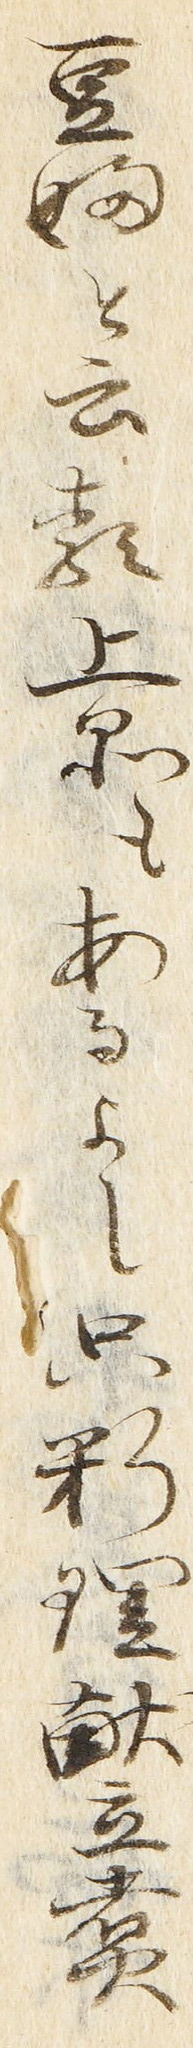豆ふと云類上品もあるよし只料理献立煮
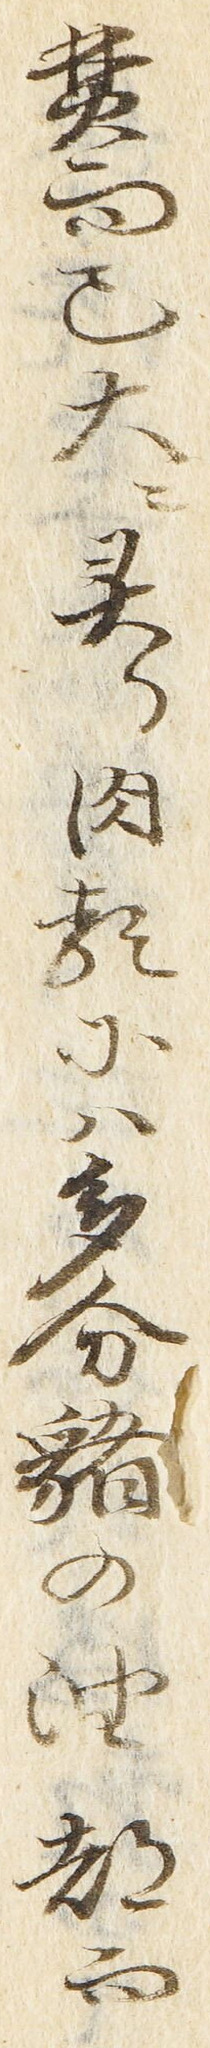焚而己大に異り肉類には多分の油都而
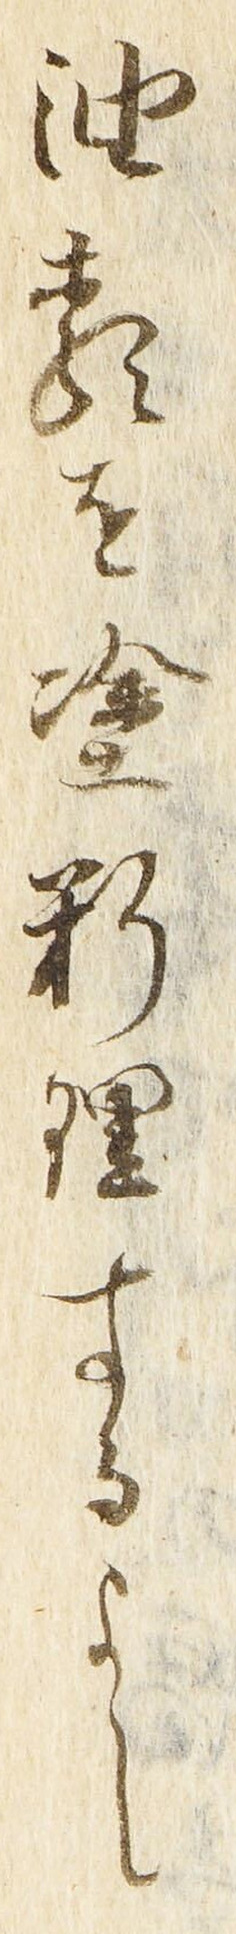油類を塗料理するよし
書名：唐物語
